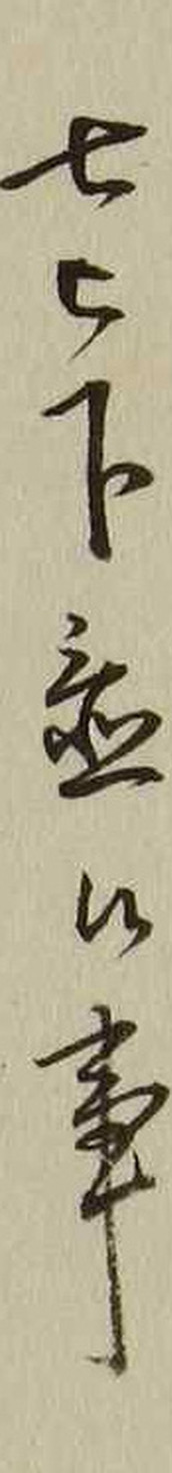七被下置候事
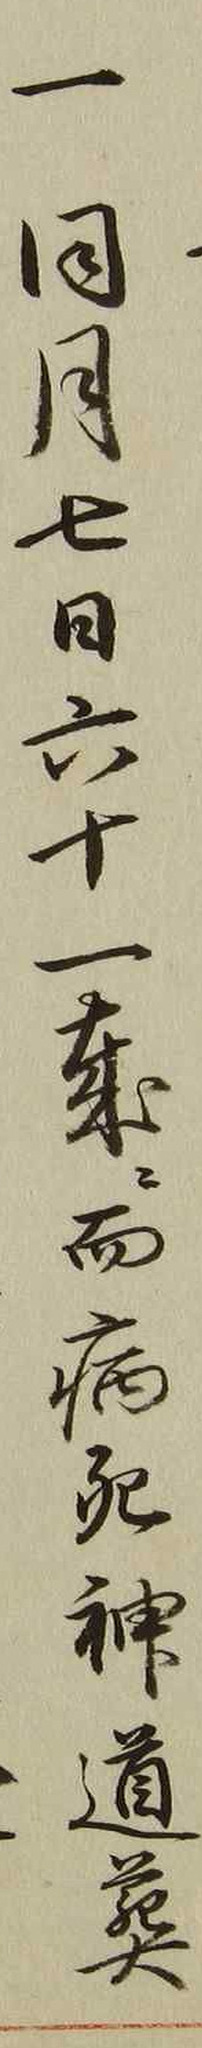一同月七日六十一歳に而病死神道葬
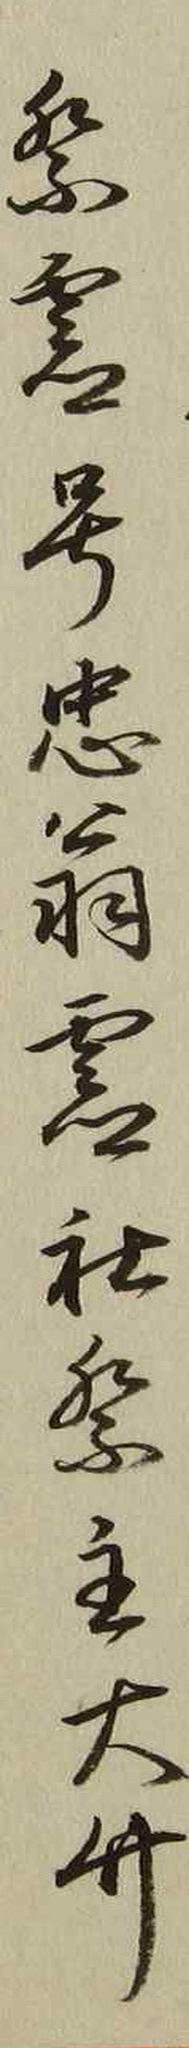祭霊号忠翁霊社祭主大竹
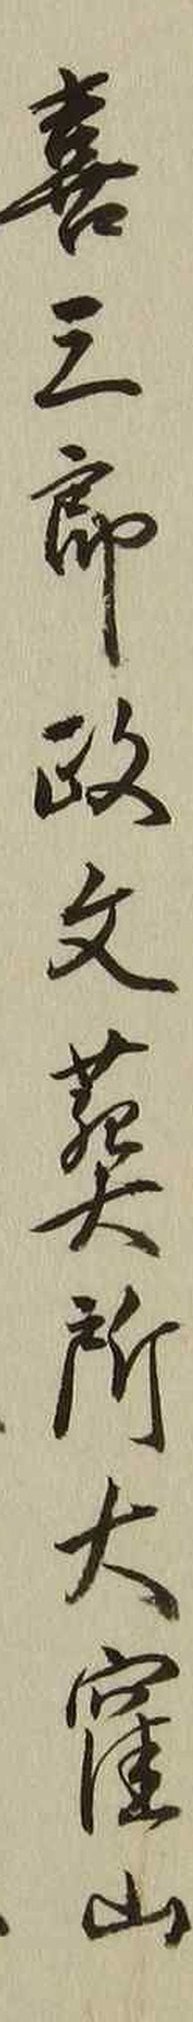喜三郎政文葬所大窪山
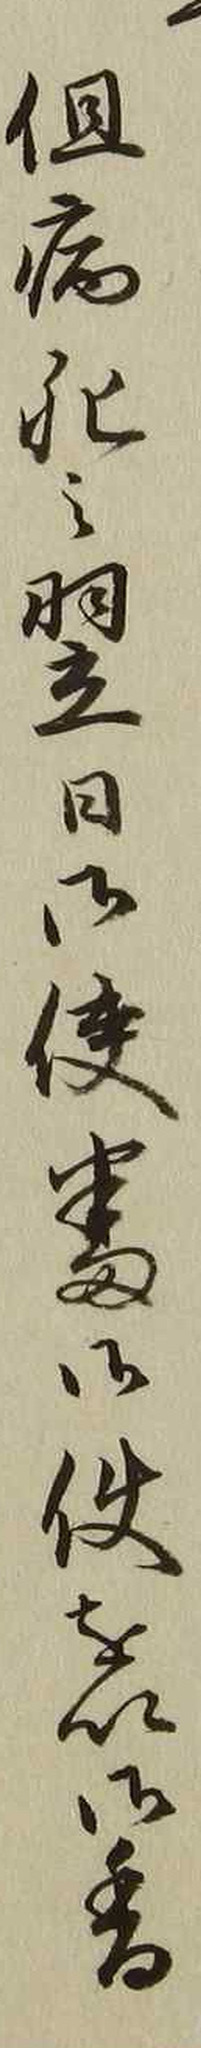但病死之翌日御使番御使を以御香
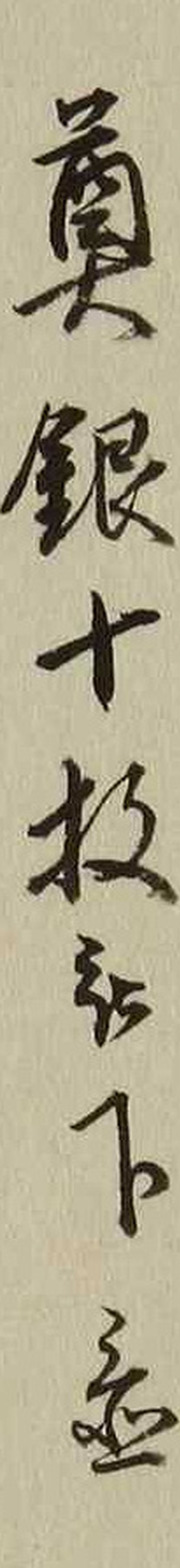典銀十枚被下置
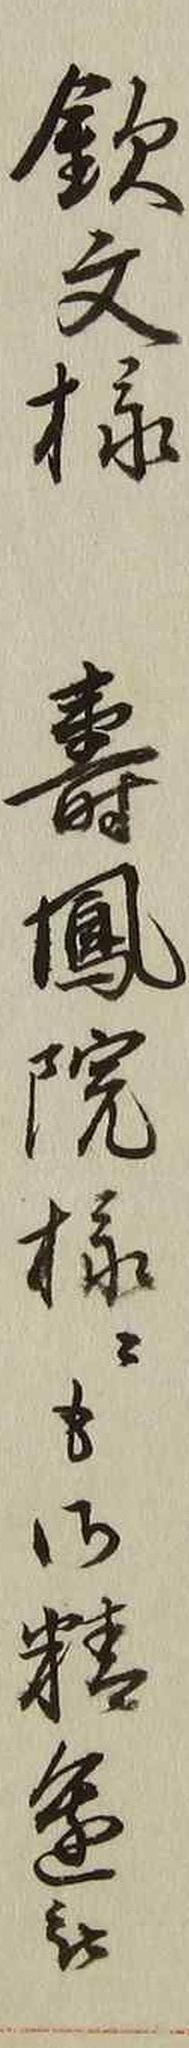欽文様寿鳳院様にも御精還被
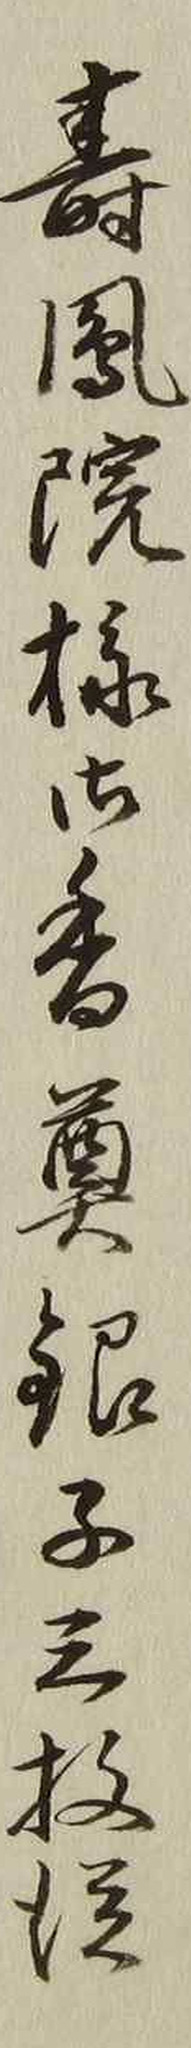寿鳳院様御香典銀子三枚従
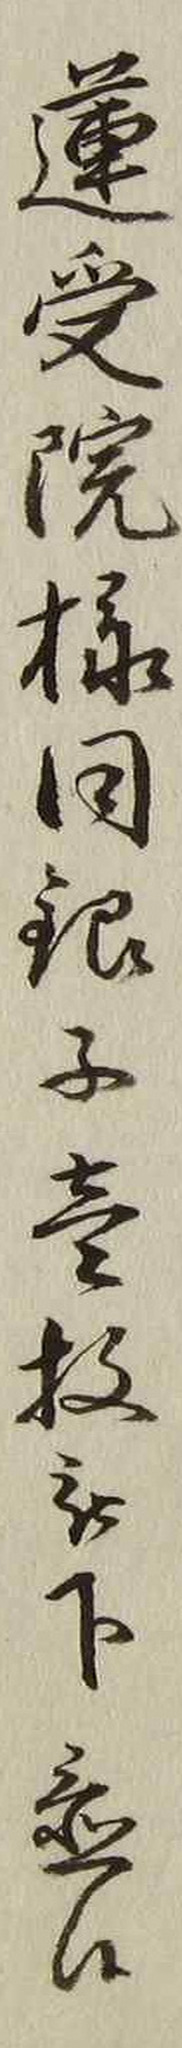蓮受院様同銀子壱枚被下置候
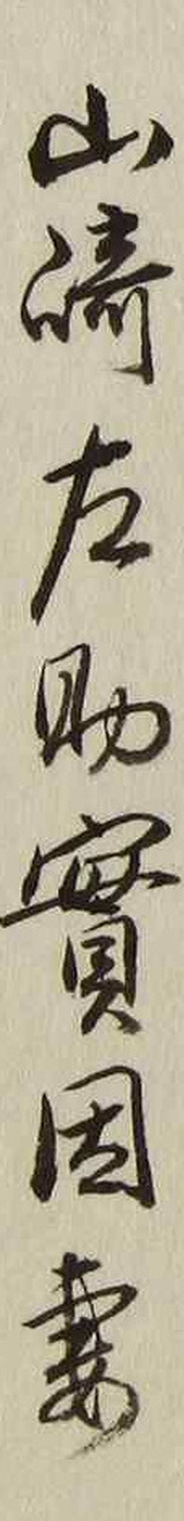女山崎左助実因妻
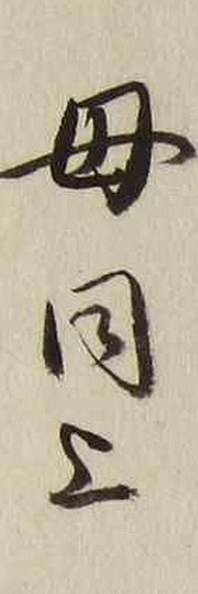母同上

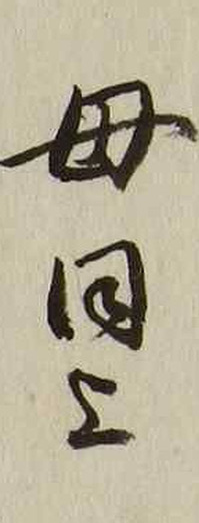母同上
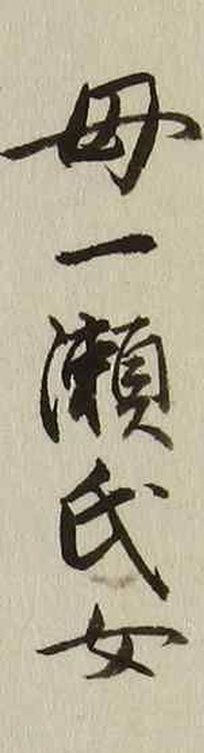母一瀬氏女
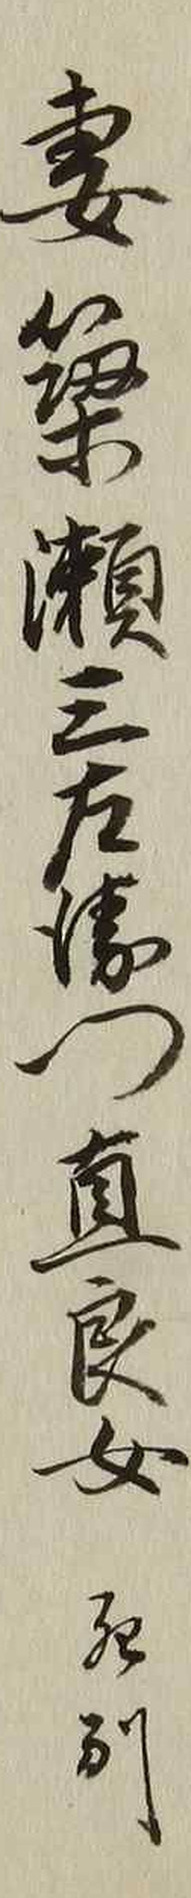妻簗瀬三左衛門直良女離別
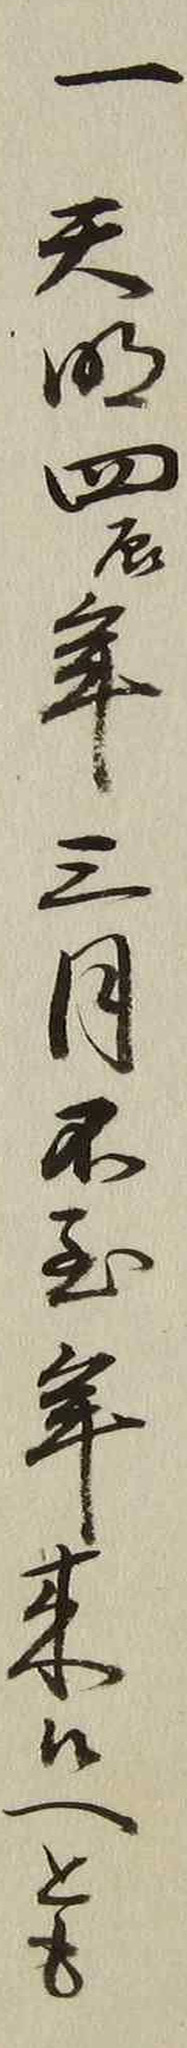一天明四辰年三月不至年來候へとも
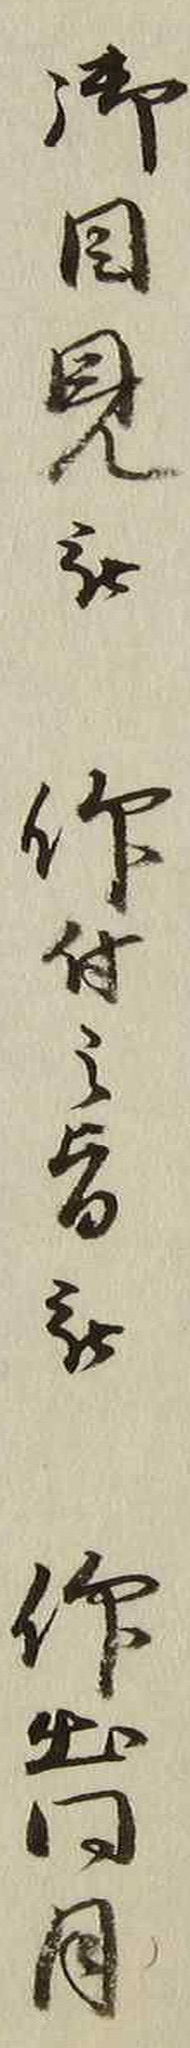御目見被仰付之旨被仰出同月
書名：諸士系譜　巻之125　た之部1
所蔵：会津若松市立会津図書館
